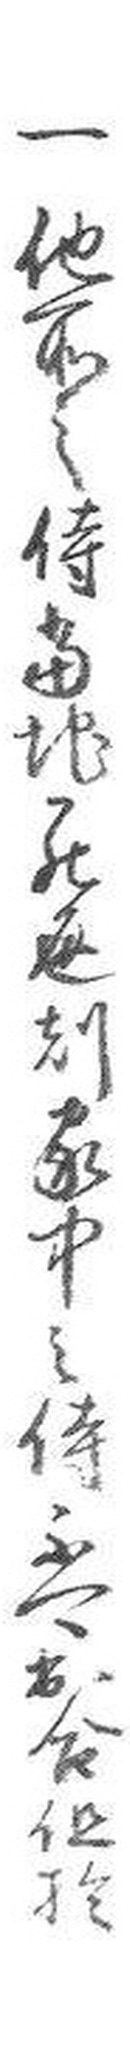一他所之侍当地罷通刻家中之侍不可出合但於
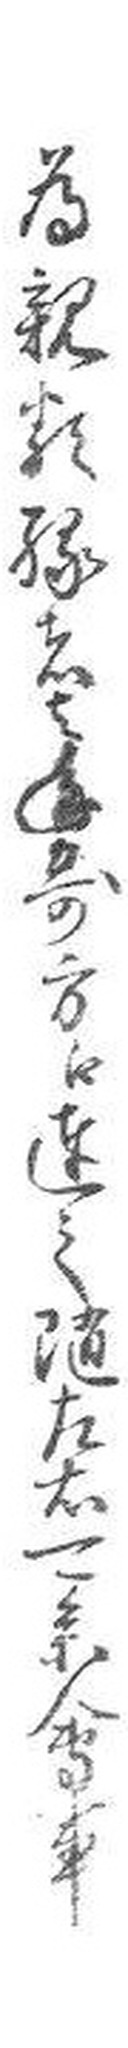為親類縁者者年寄方江達之随左右可参会事
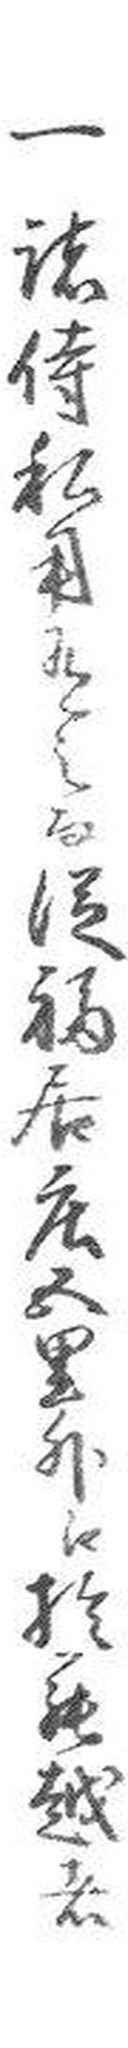一諸侍私用有之而従福居五里外江於罷越者
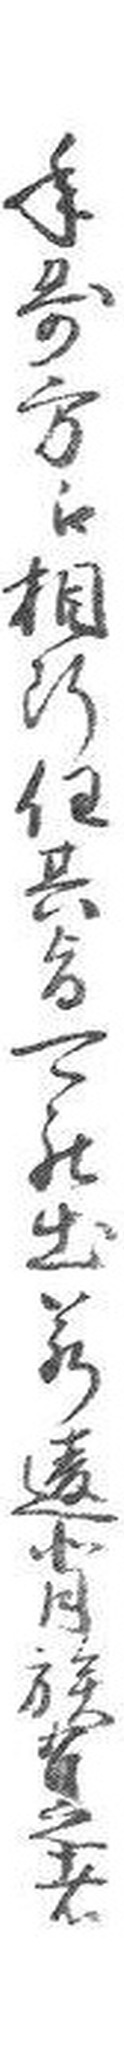年寄方江相断任其旨可罷出若違背族有之者
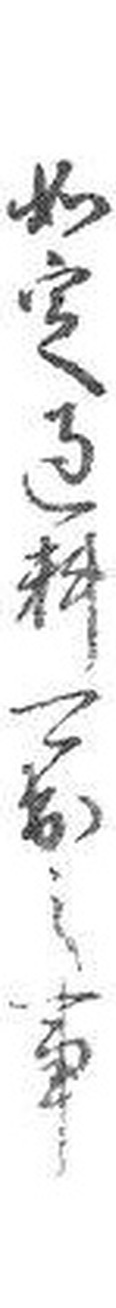如定過料可出之事
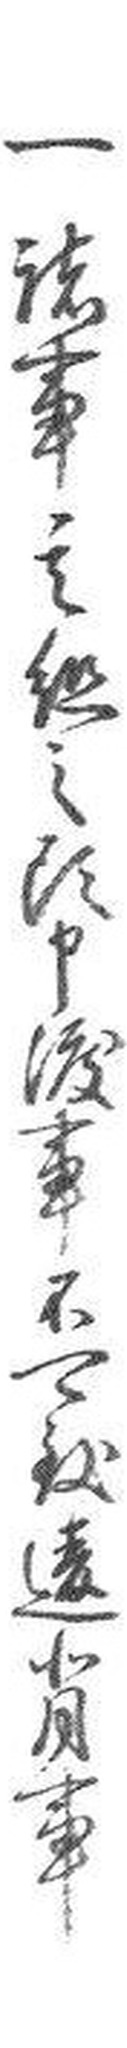一諸事其組之頭申渡事不可致違背事
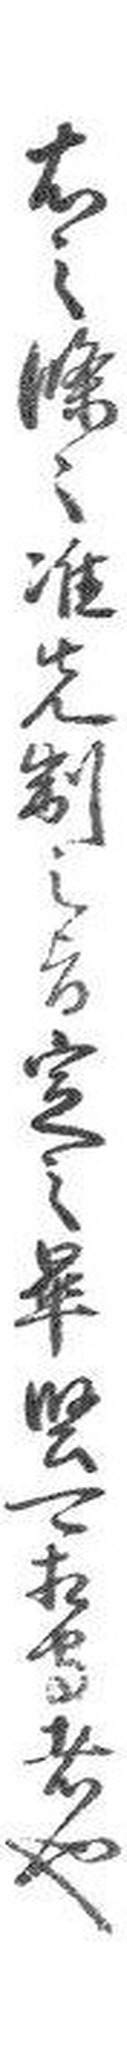右之条々准先制之旨定之畢堅可相守者也
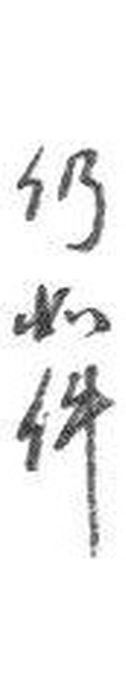仍如件
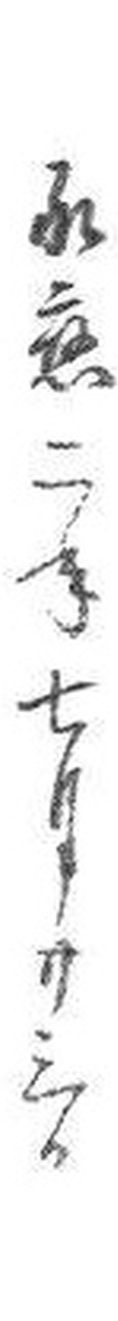承応二年七月廿三日
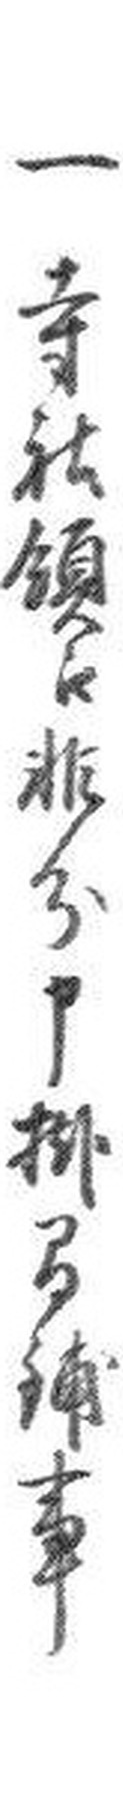一寺社領江非分申掛間敷事
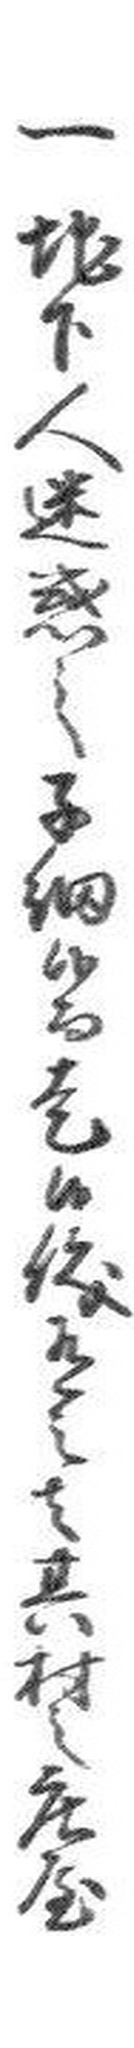一地下人迷惑之子細候而走候儀有之者其村々之庄屋
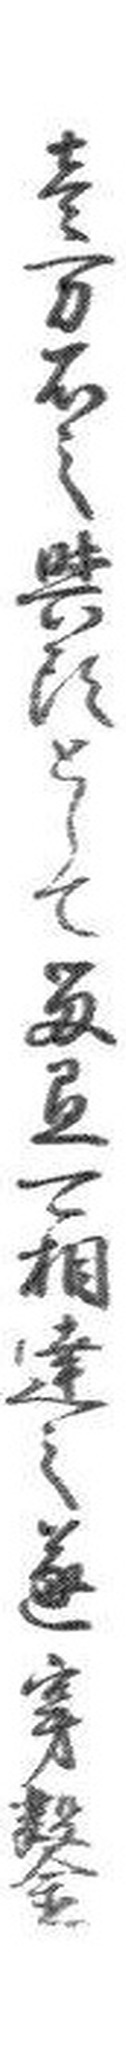壱万石之与頭として留置可相達之遂穿鑿
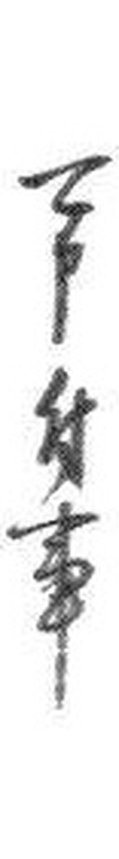可申付事
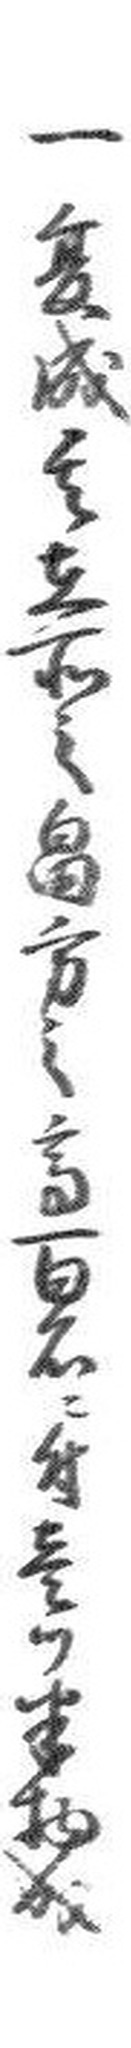一夏成其在所之畠方之高百石ニ付壱ッ半物成
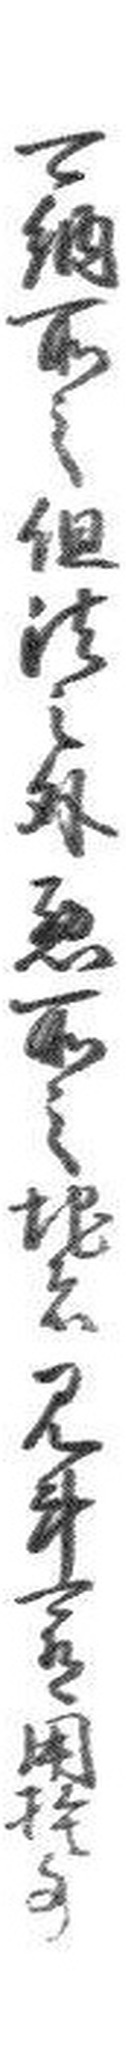可納所之但法之外悪所之地者見斗可有用捨事
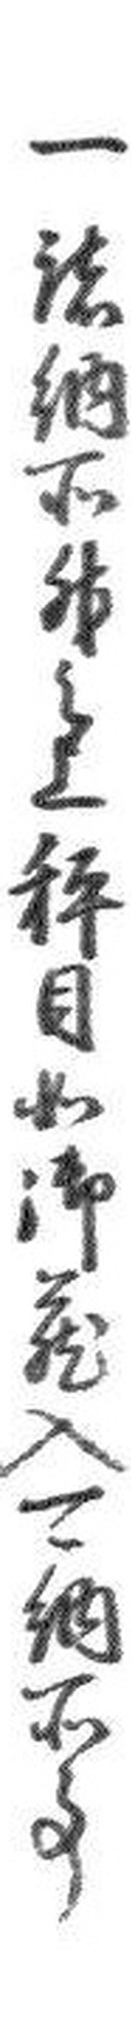一諸納所升之上秤目如御蔵入可納所事
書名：家譜 五 光通公 従寛永十三年到万治二年
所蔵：福井県文書館 Fukui Prefectural Archives
